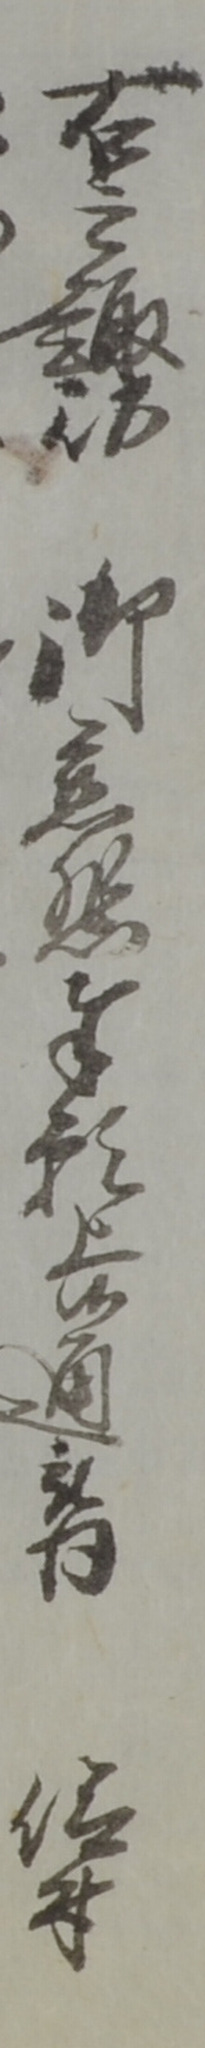右之趣以御慈悲奉願上候通被為仰付
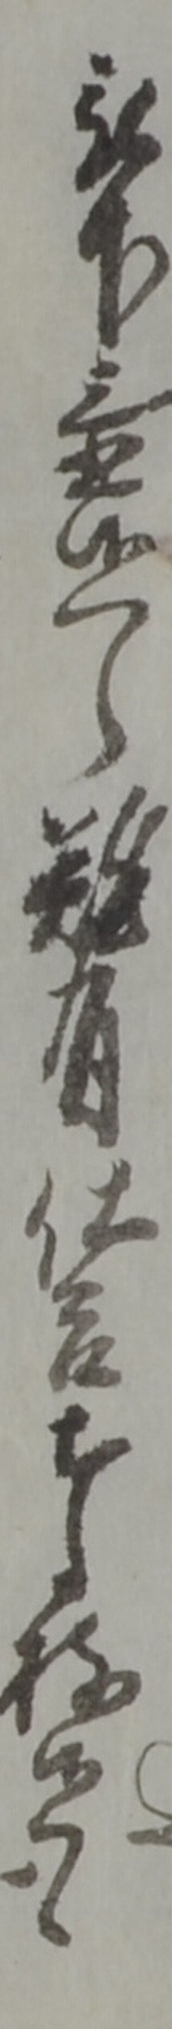被下置候ハヽ難有仕合奉存候以上
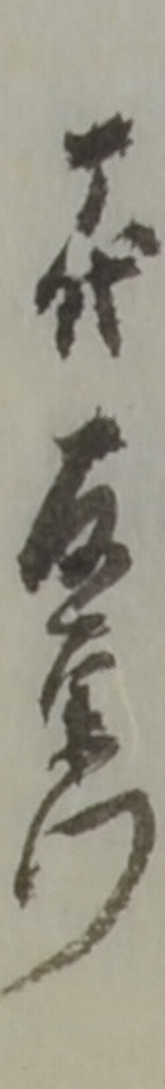丁代友右衛門
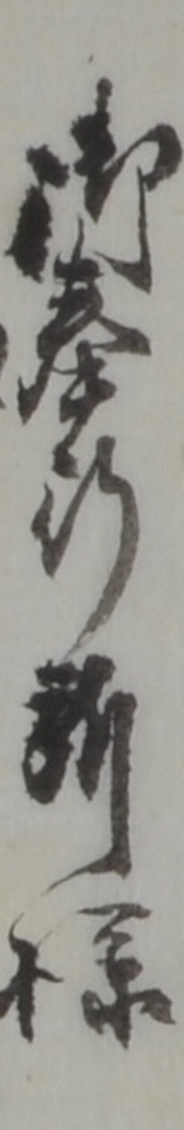御奉行所様
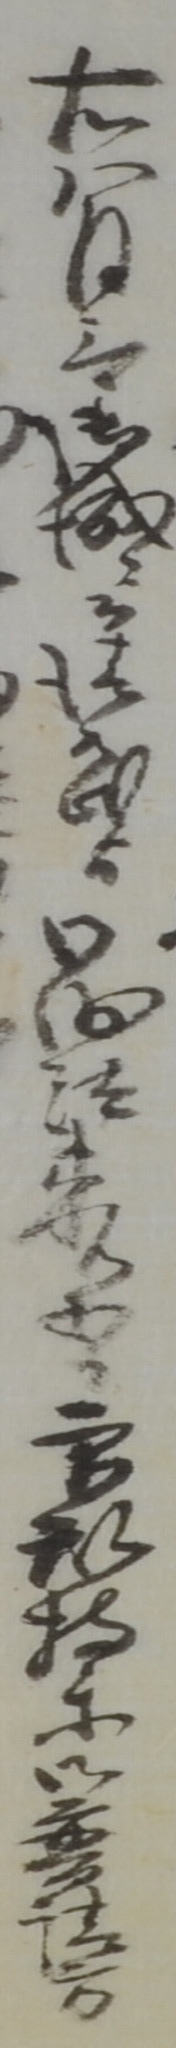右八月三日御城ニ而清水氏ゟ御沙汰来り五日印形持参御普請方
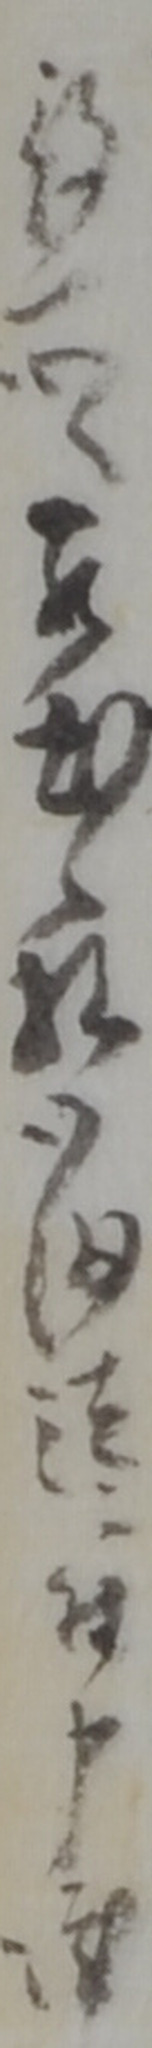役所へ罷出候様御沙汰ニ付申渡候
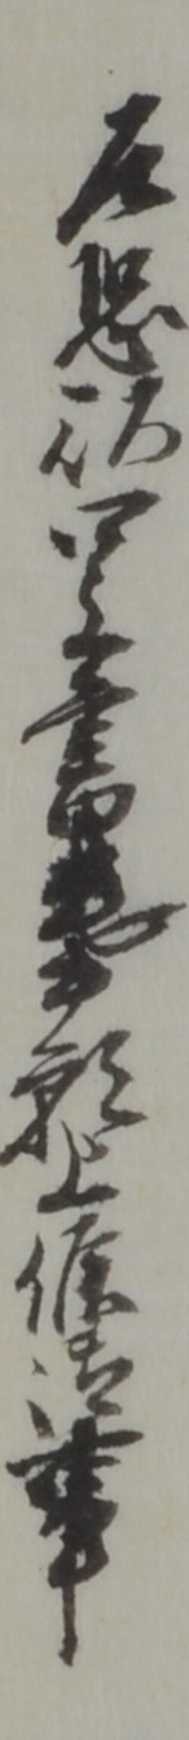乍恐以口上書奉願上候御事
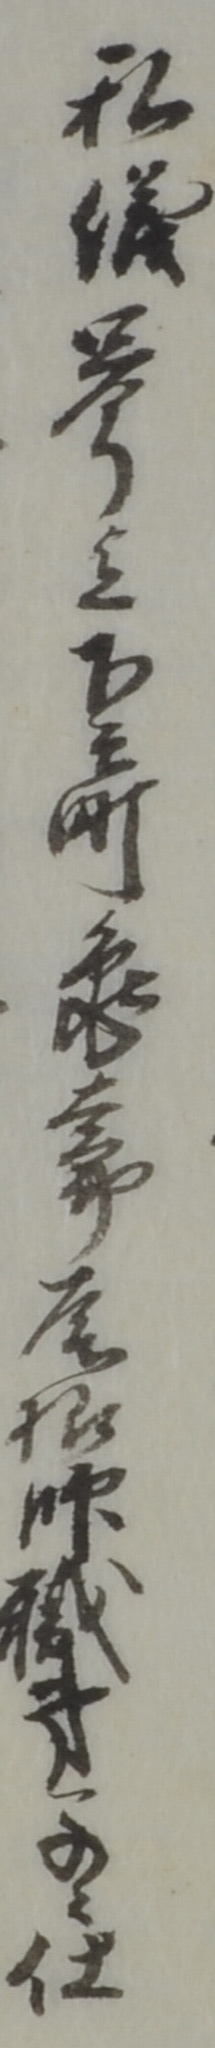私儀只今迄下之町亀太郎屋根師職弟子ニ仕
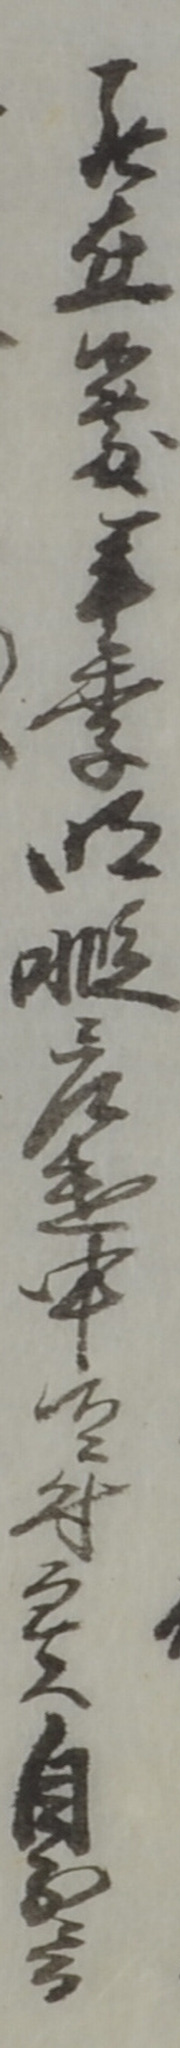罷在候処年季明暇差遣候ニ付而者自分ニ而
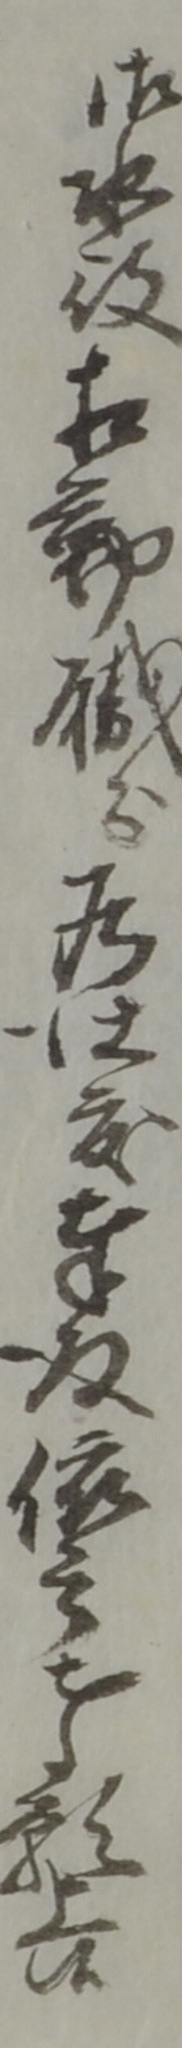御水役相勤職分為仕度奉存依之奉願上候
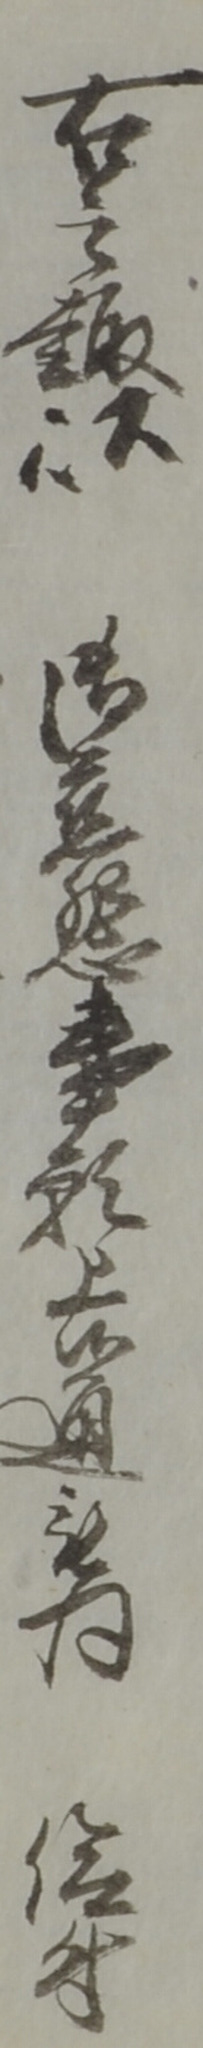右之趣以御慈悲奉願上候通被為仰付
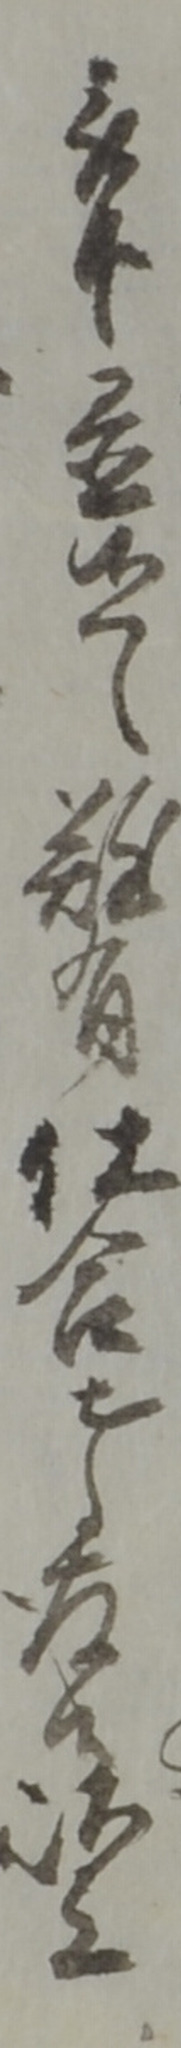被下置候ハヽ難有仕合奉存候以上
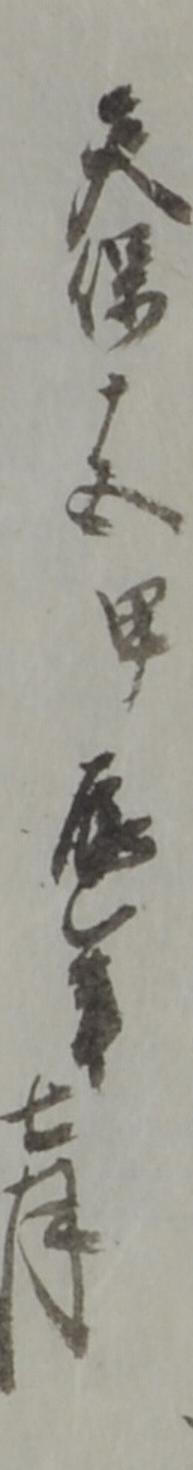天保十五甲辰年下之町
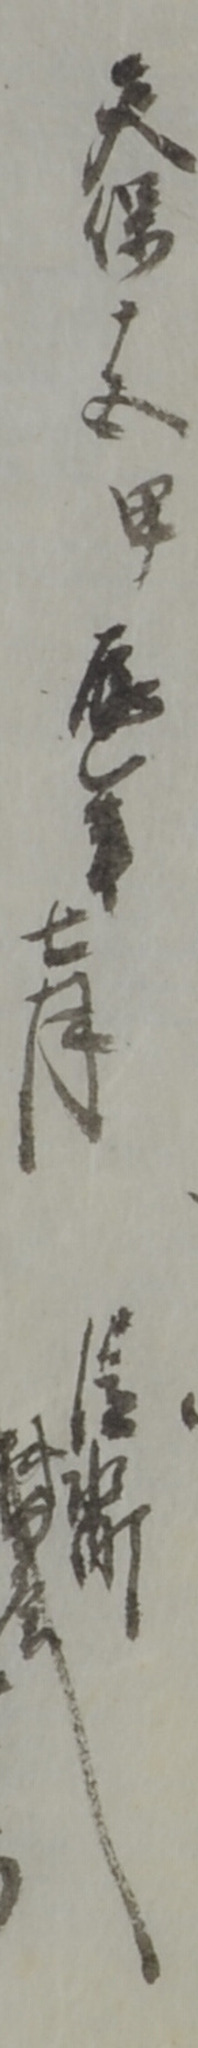天保十五甲辰年下之町
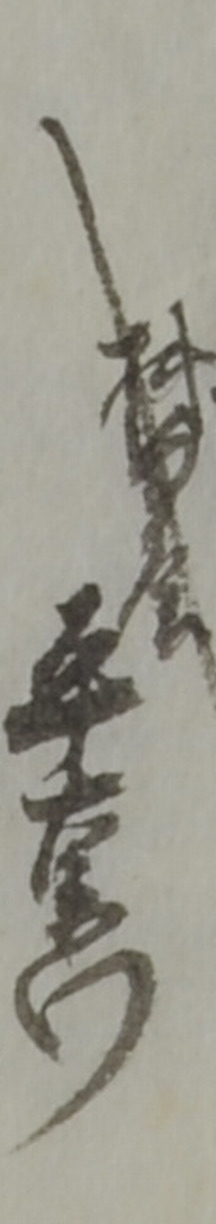平右衛門
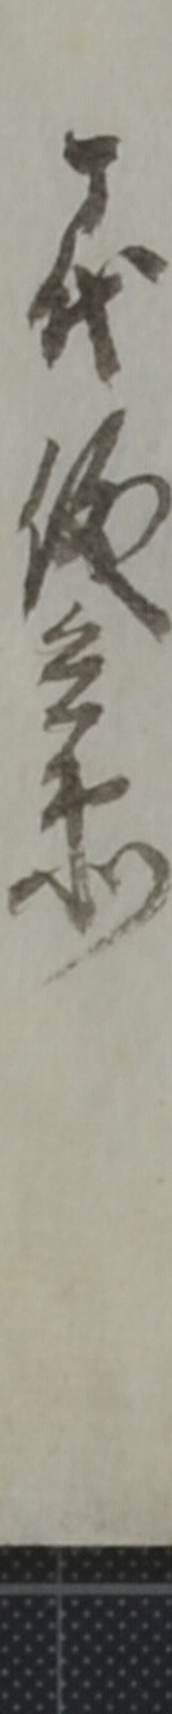丁代儀兵衛
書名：諸願書控簿
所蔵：伊那市立高遠町図書館・合同会社AMANE
